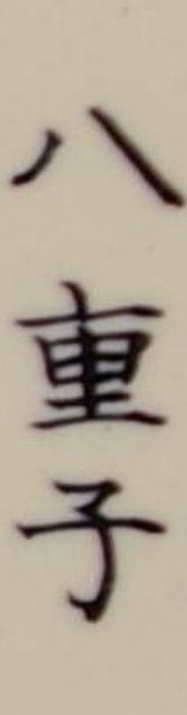八重子
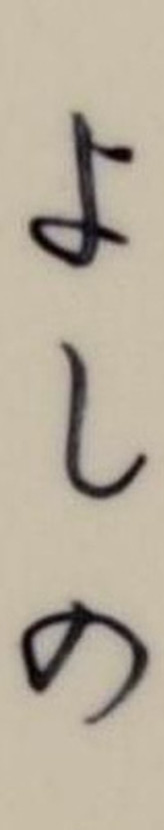よしの
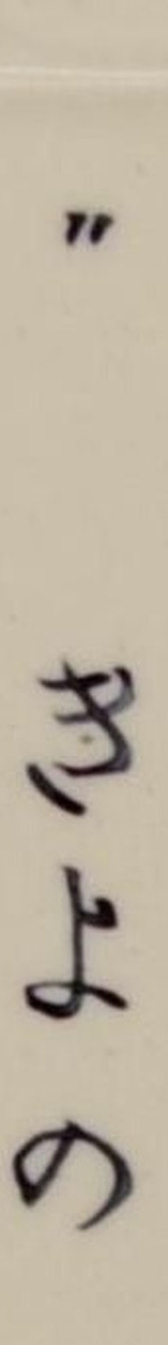きよの
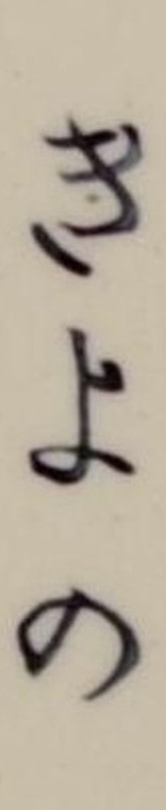きよの
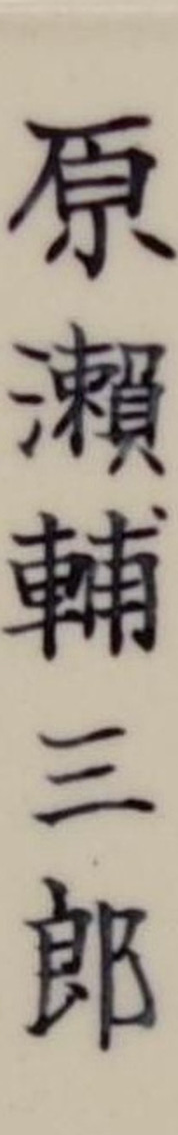原瀬輔三郎
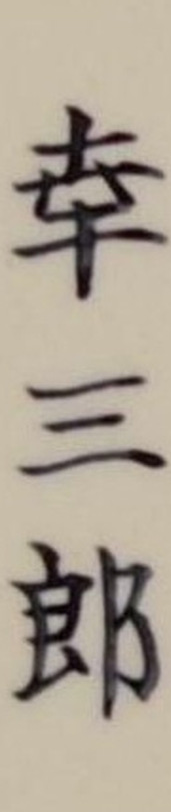幸三郎
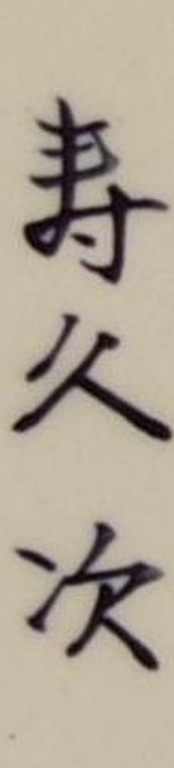寿久次
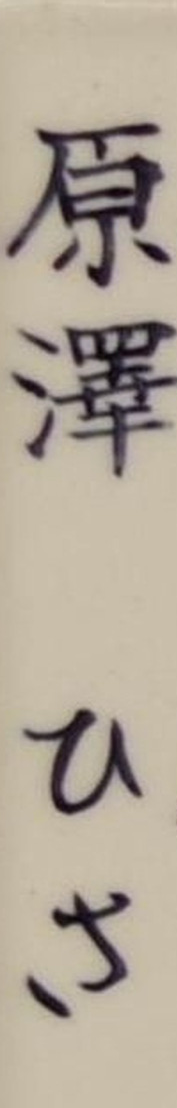原澤ひさ

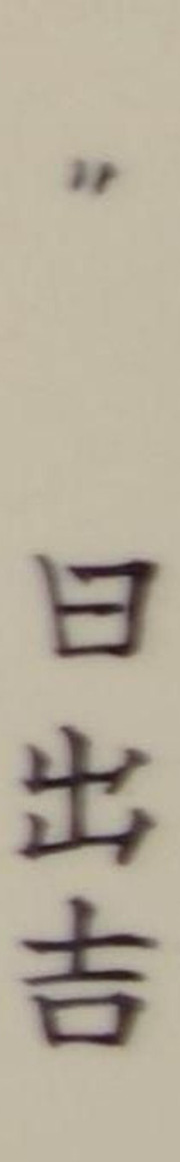日出吉
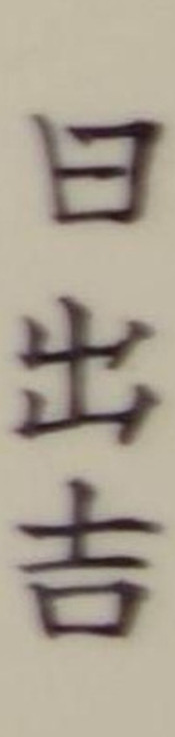日出吉
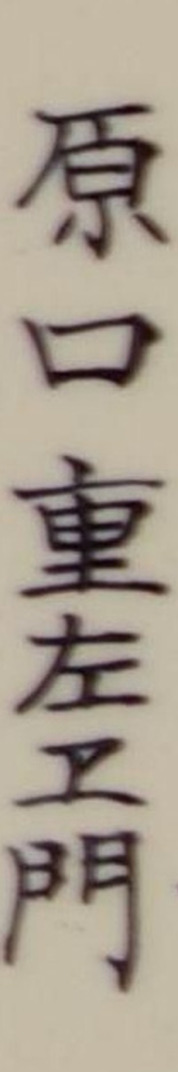原口重左ヱ門
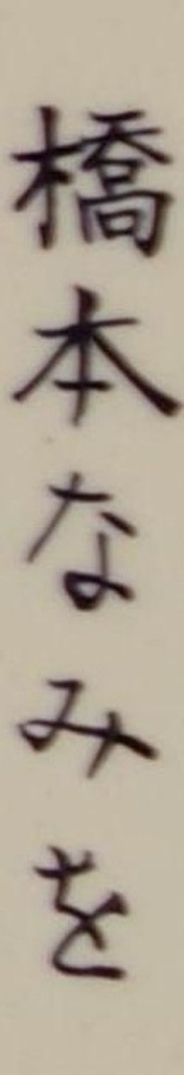橋本なみを
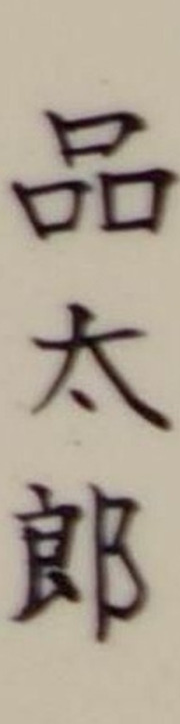品太郎
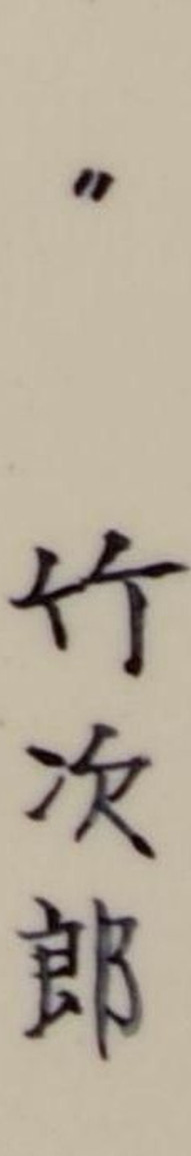竹次郎
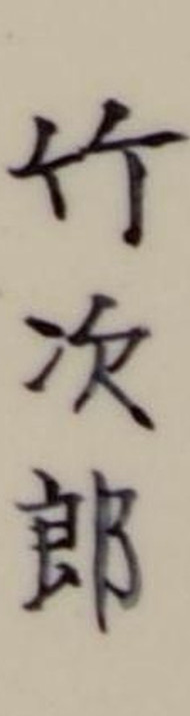竹次郎
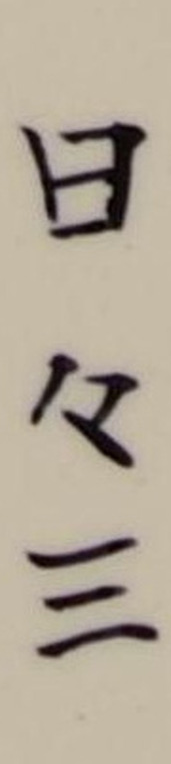日々三
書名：M~S
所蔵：高野山金剛峯寺
